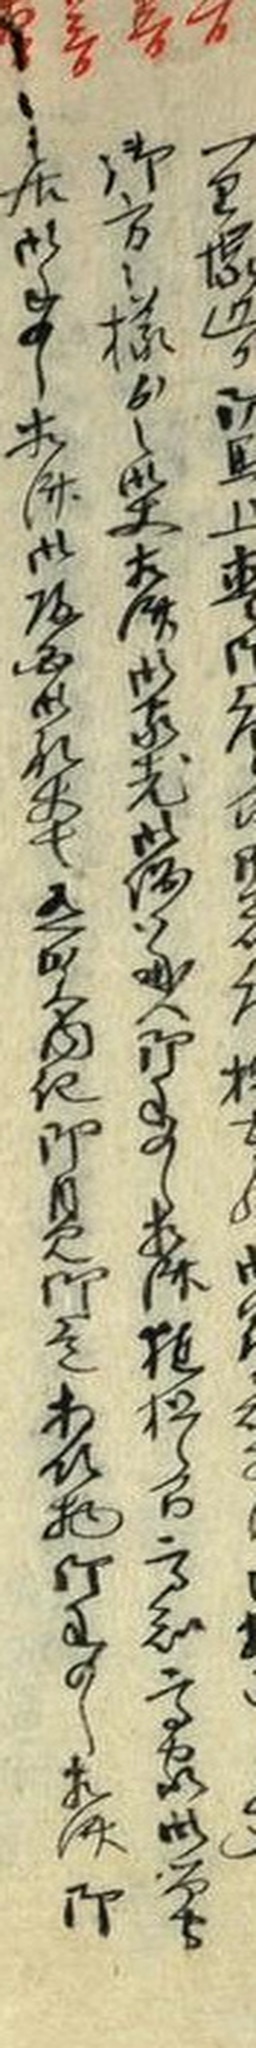居御手のし相済御帰国御礼使者有賀内記御目見御意拝領物御手のし相済御
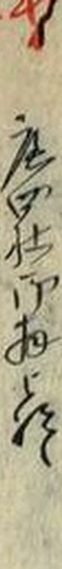庭四社御拝被遊候
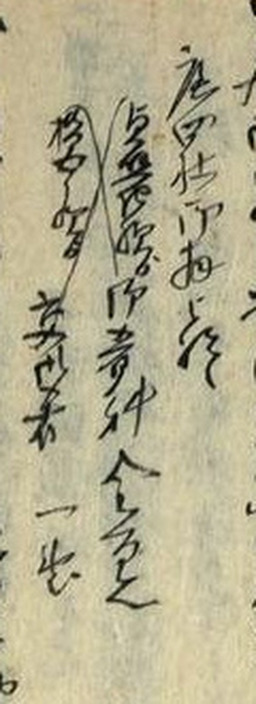貞照院様ゟ御肴料金百疋
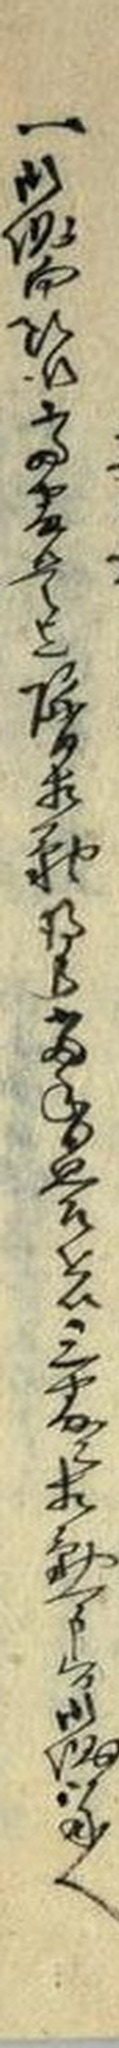一御側向頭取当番是迄隔日相勤及も当年ゟ思召を以三番二相勤可申旨御側御用人
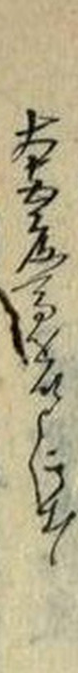大宮藤馬を以被仰出候
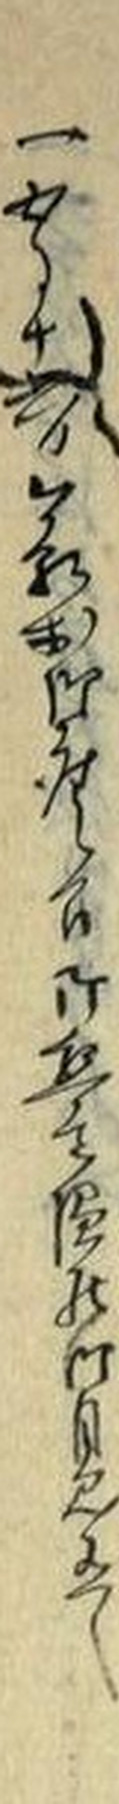一五月十六日今朝於御座之間御懇意隠居御目見有之

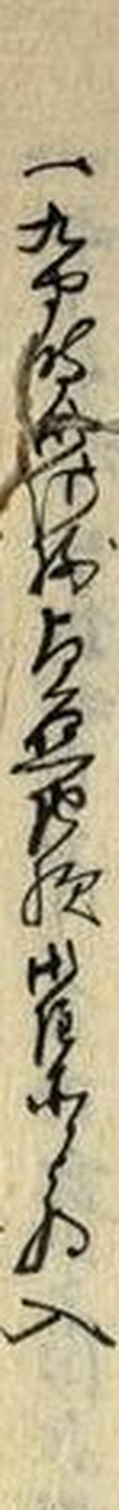一九半時御供揃貞照院様御住所被為入
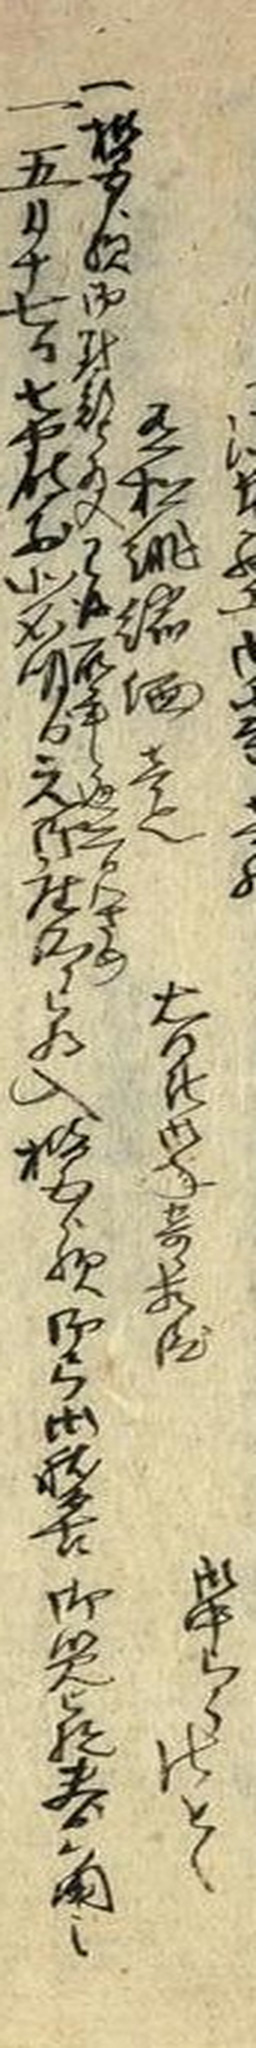一五月十七日七半時前北不明ゟ元御座所へ被為入揩五郎様御弓稽古御覧被遊夫ゟ角之
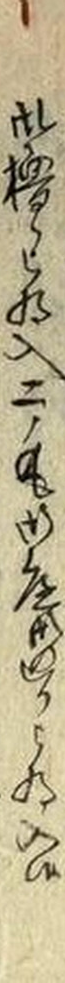御櫓へ被為入二ノ丸御庭御廻り被為入候
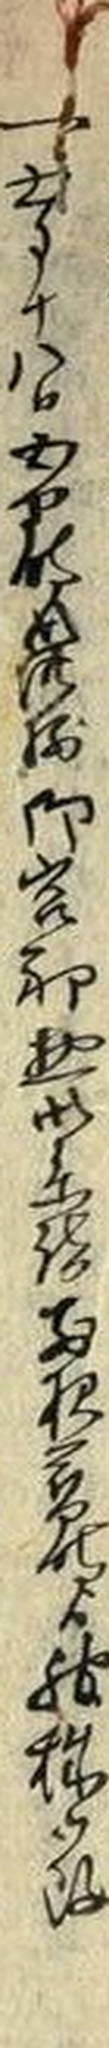一五月十八日五半時御供揃御宮初惣御参詣前夜暮時ゟ服穢御改
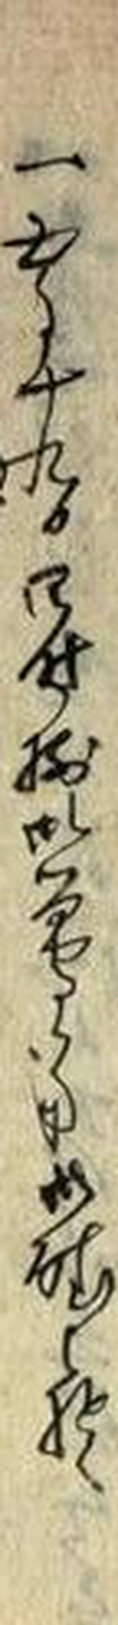一五月十九日四時揃御留守御用御聴被遊候
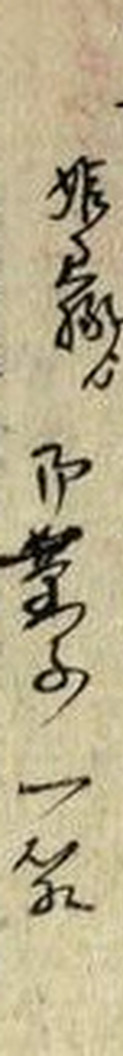姫君様ゟ御菓子一箱
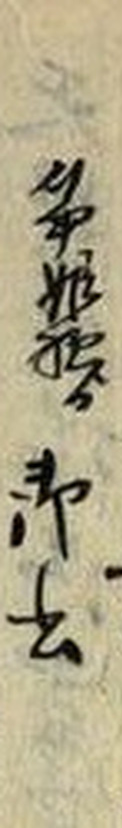箏姫様ゟ御書
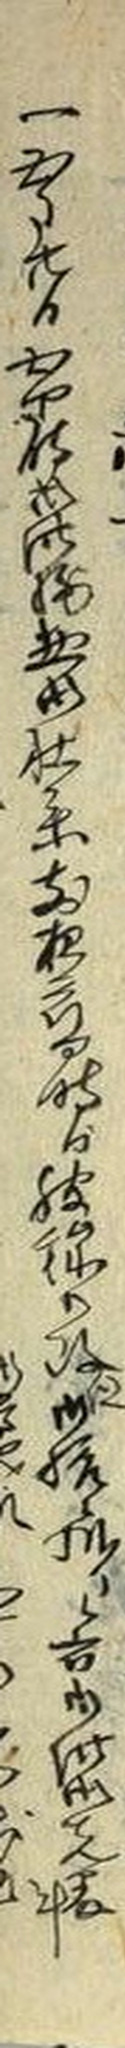一五月廿日五半時御供揃惣御社参前夜暮時ゟ服穢御改但御膳掛り之者御供御先番斗
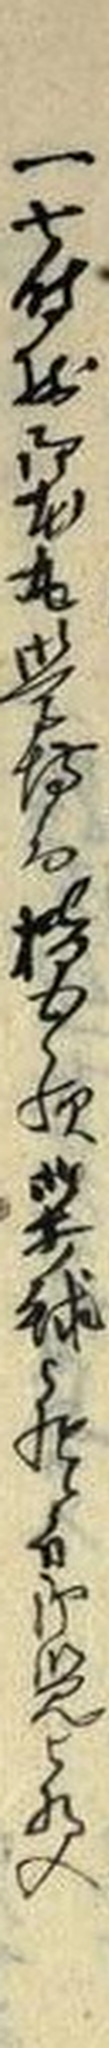一七時揃御本丸御馬場二而揩五郎様御打毬被遊候ニ付御覧被為入
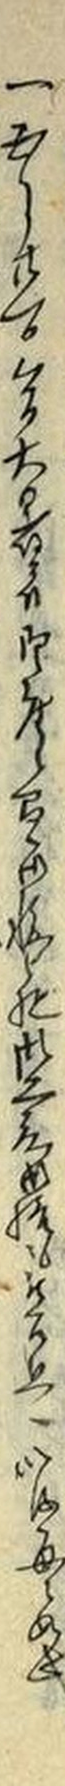一五月廿一日今日大暑ニ付御座之間御移被遊御二度御膳も被召上以後毎々如此
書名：少傅日録抄（斉承付側向頭取日記、在国）
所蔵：福井県文書館 Fukui Prefectural Archives
